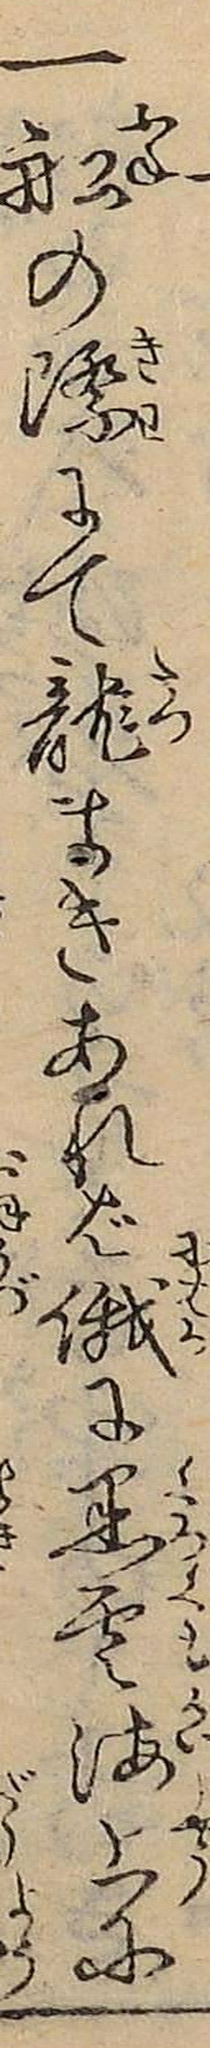一船の際にて竜まきあれば俄に黒雲海上に
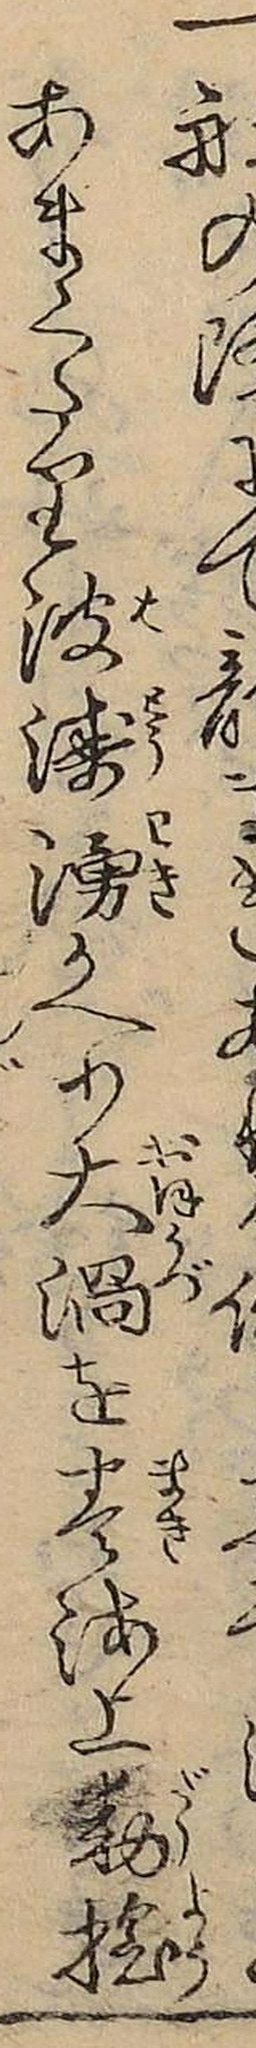あまくたり波濤湧かへり大渦を巻海上動揺
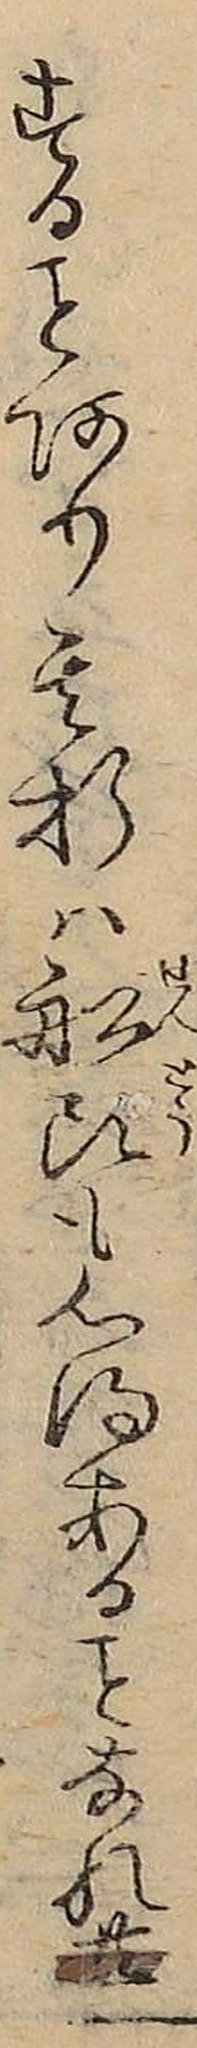することあり其折は船頭も心得あることなれ共
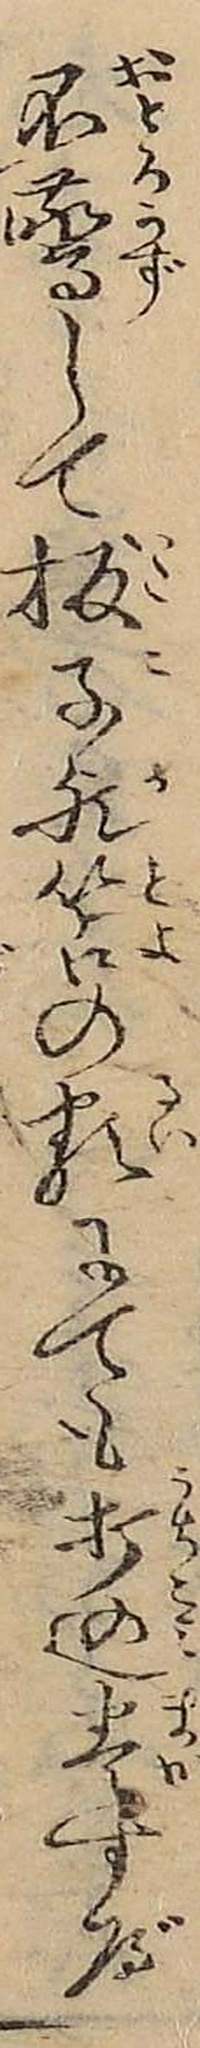不驚して板子歟苫の類にても打込巻すべ
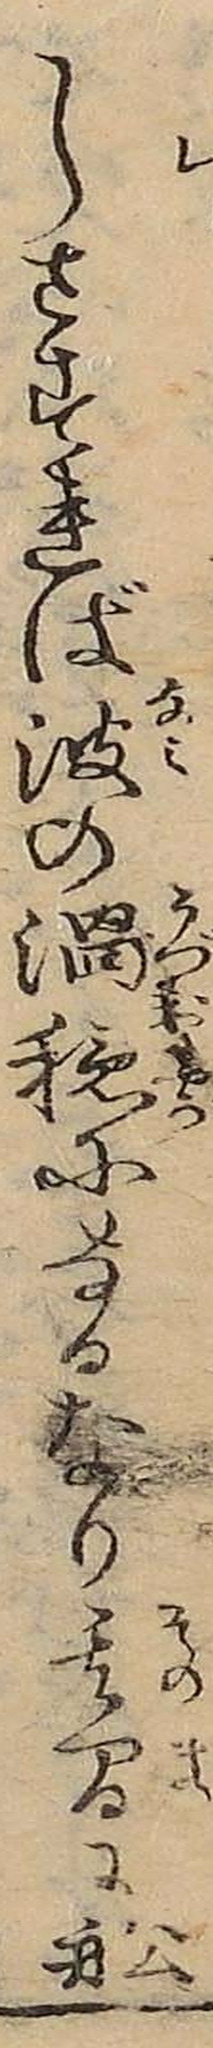しさすれば波の渦穏になるなり其間に船

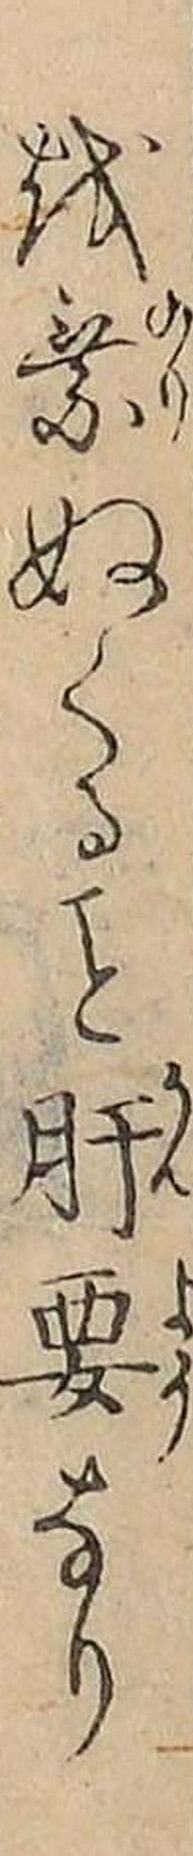を乗ぬくること肝要なり
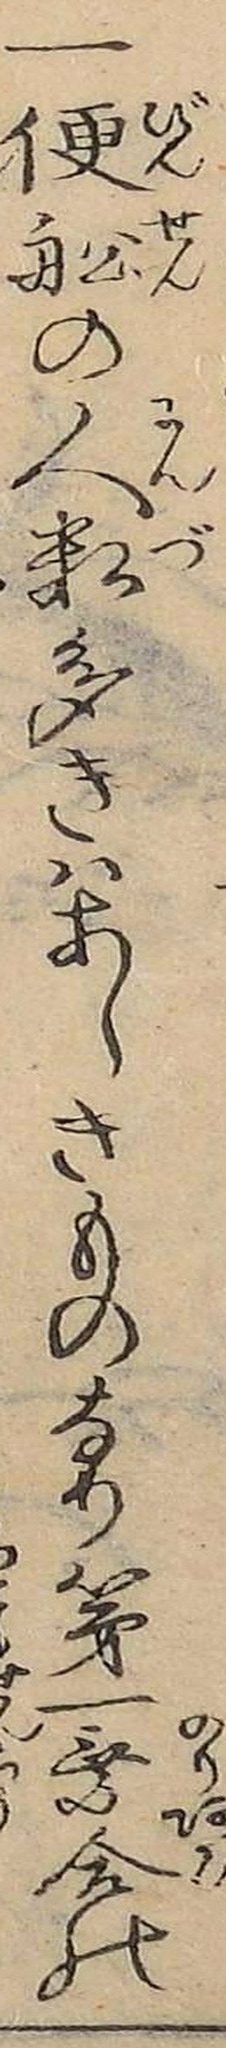一便船の人数多きはあしきものなり第一乗合の
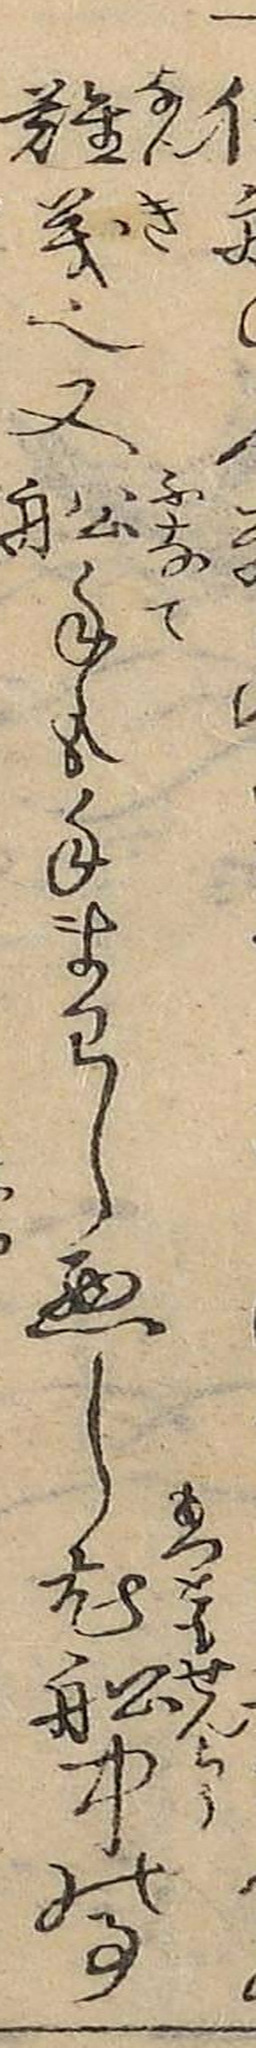難義也又船手も手まわし悪し尤船中の事
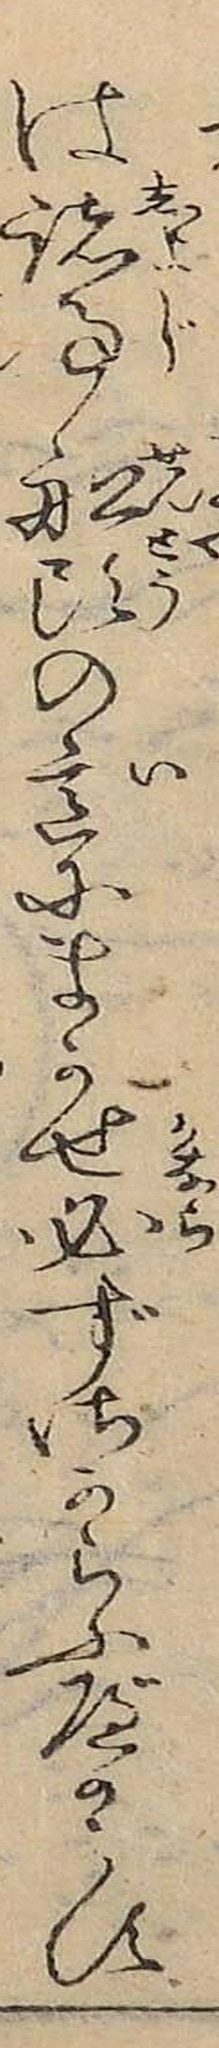は諸事船頭の意にまかせ必ずさからふべからす
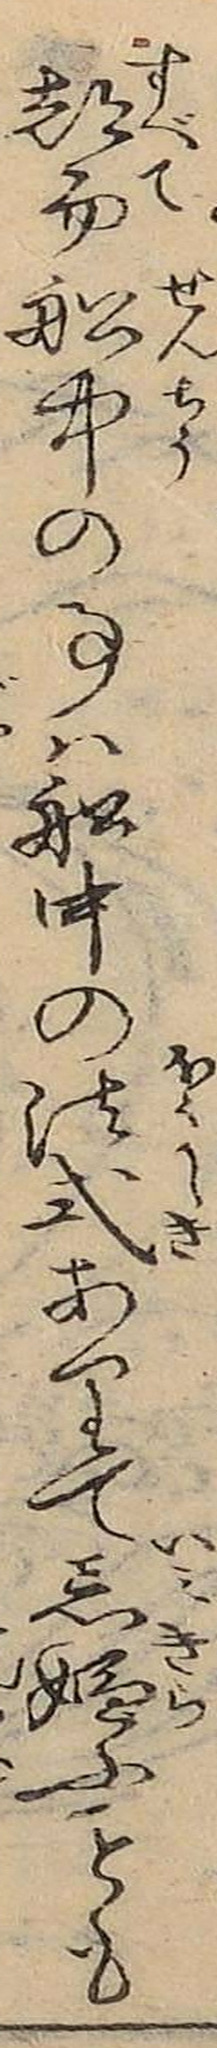都而船中の事は船中の法式ありて忌嫌ふことも
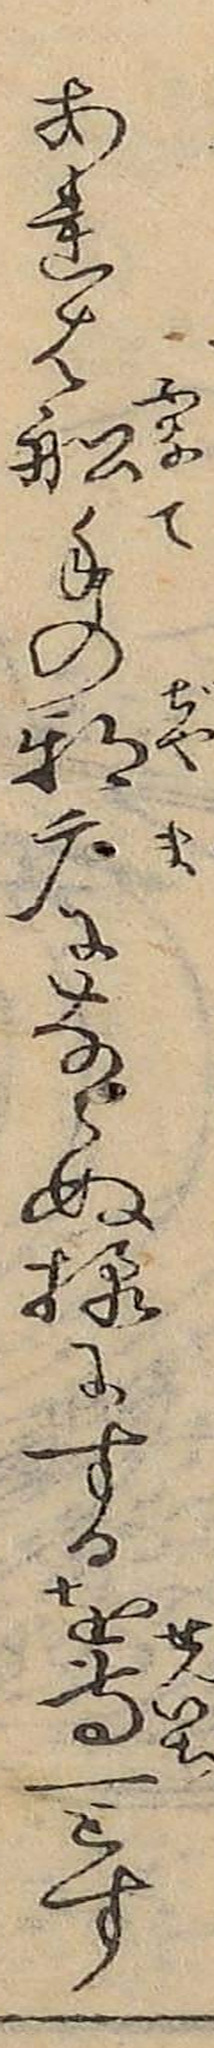あれは船手の邪魔にならぬ様にするを専一とす
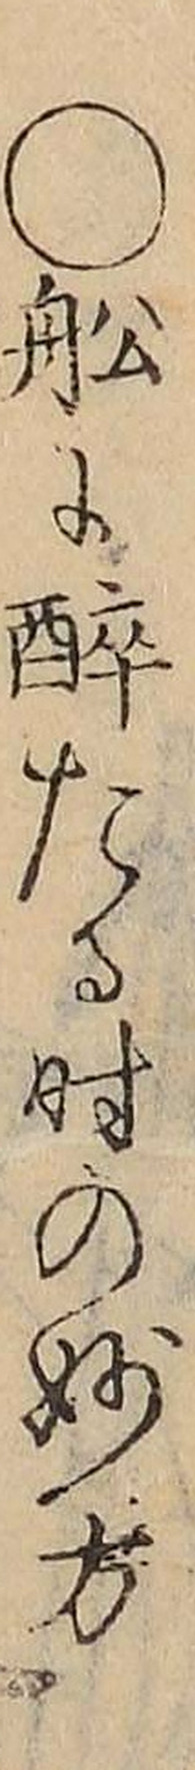○船に酔たる時の妙方
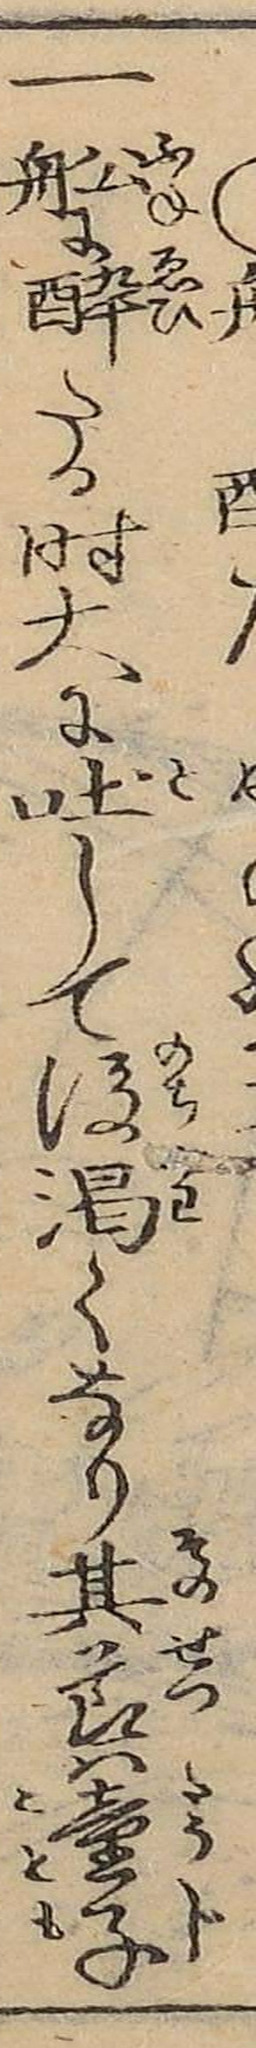一船に酔たる時大に吐して後渇くなり其節は童子
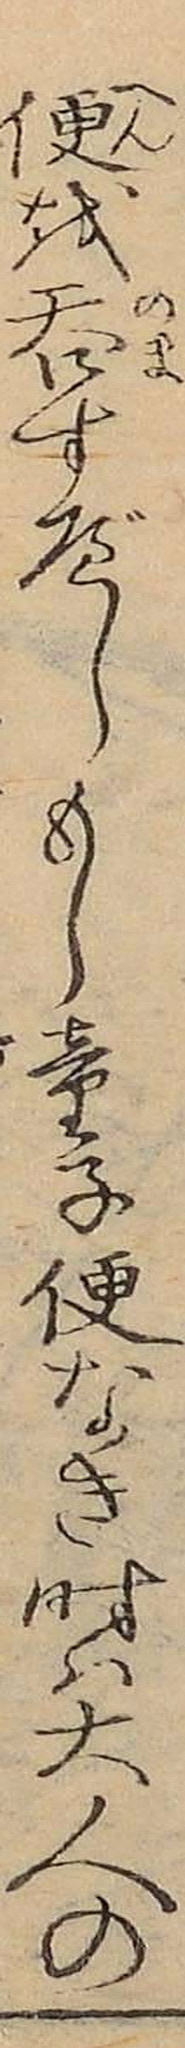便を呑すべしもし童子便なき時は大人の
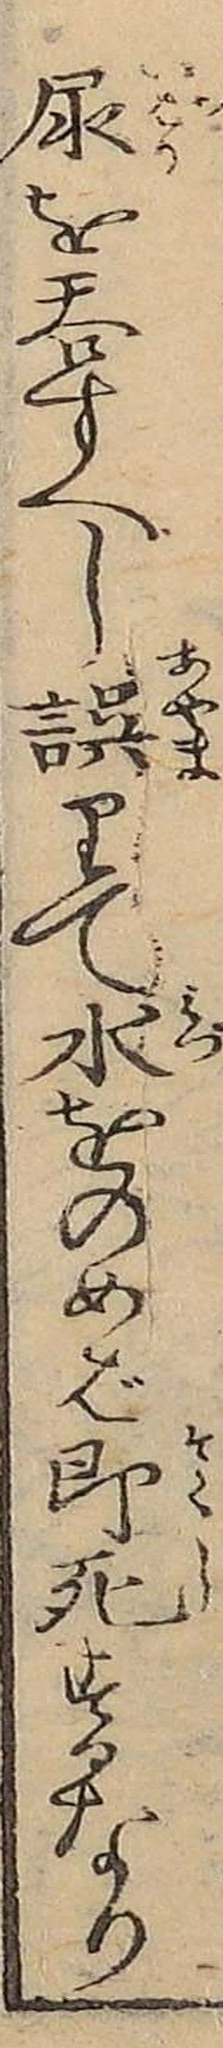尿を呑すへし誤りて水をのめば即死するなり
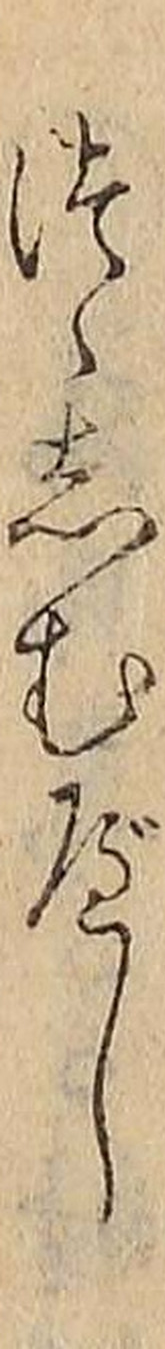つゝしむべし
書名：旅行用心集
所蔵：神戸大学附属図書館 国文学研究資料館
